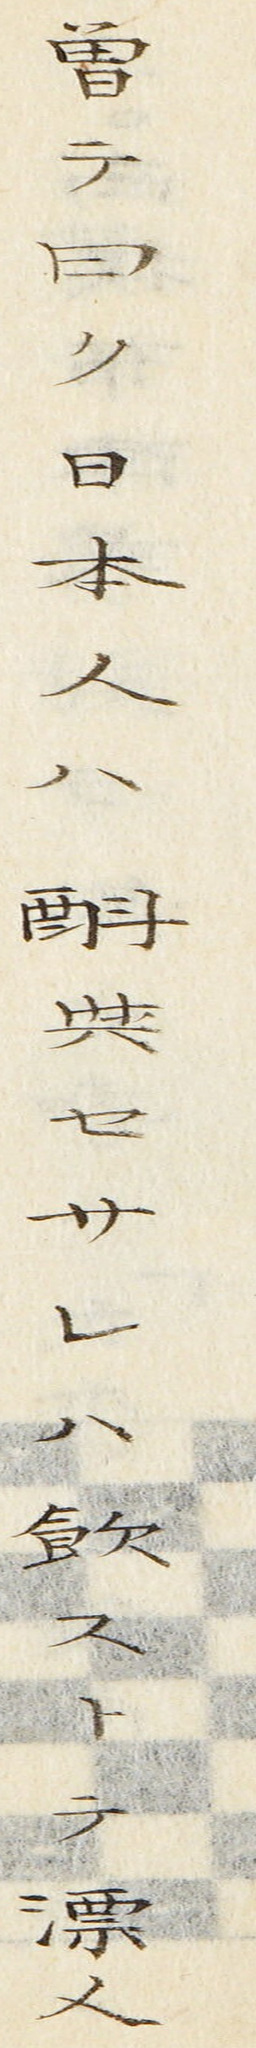曽テ曰ク日本人ハ酙与セサレハ飲ストテ漂人
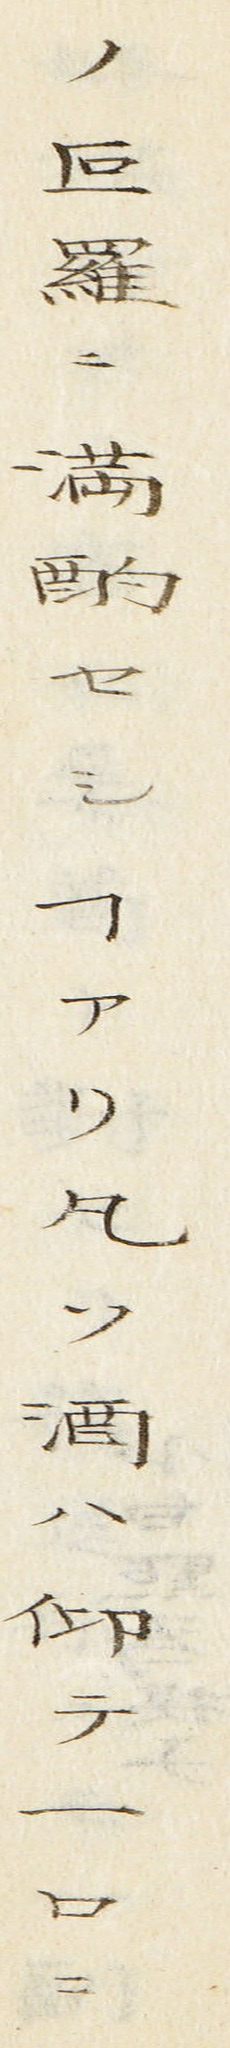ノ叵？羅ニ満酌セシコトアリ凡ソ酒ハ仰テ一口ニ
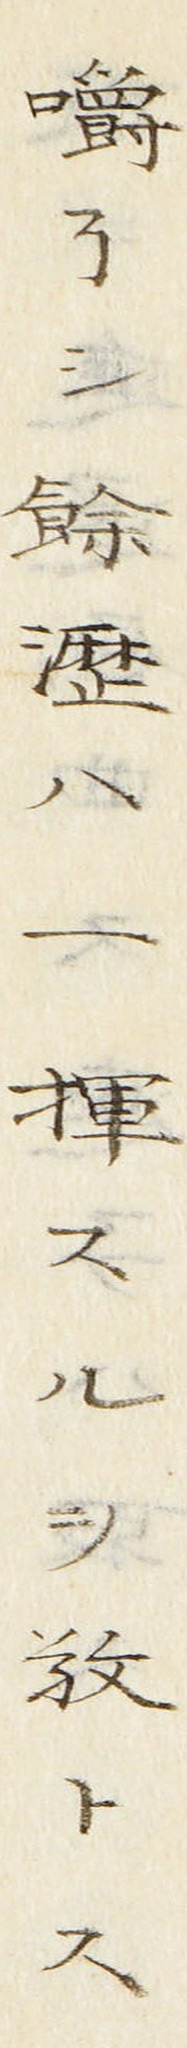嚼了シ余瀝ハ一揮スルヲ教トス
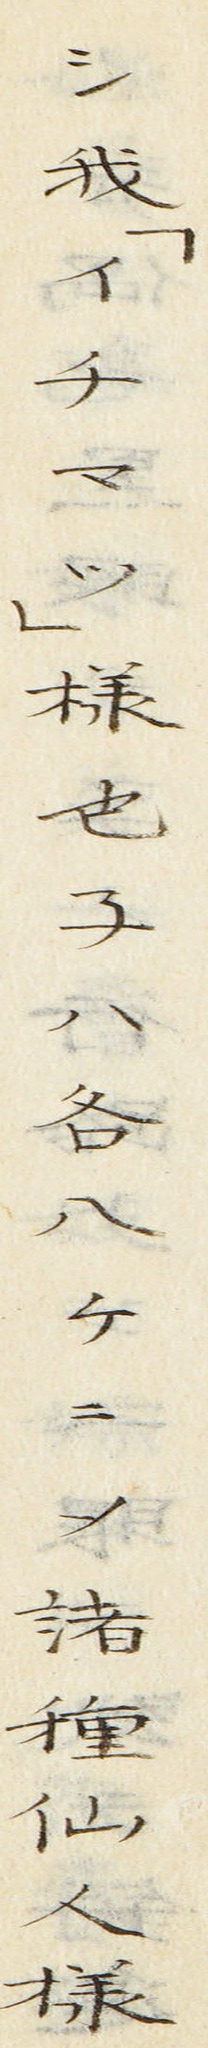シ我「イチマツ」様也子ハ各八ケニシテ諸種仙人様

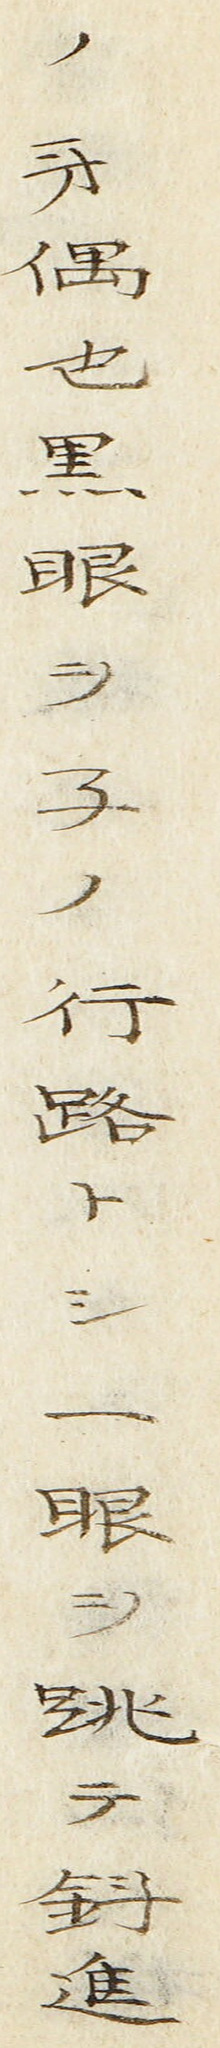ノ牙偶也黒眼ヲ子ノ行路トシ一眼ヲ跳テ斜進
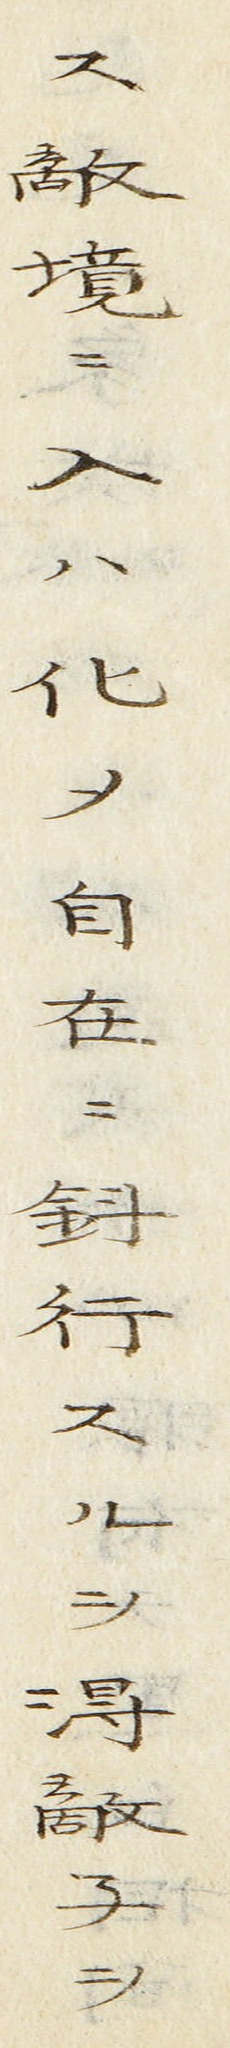ス敵境ニ入ハ化シテ自在ニ斜行スルヲ得敵子ヲ
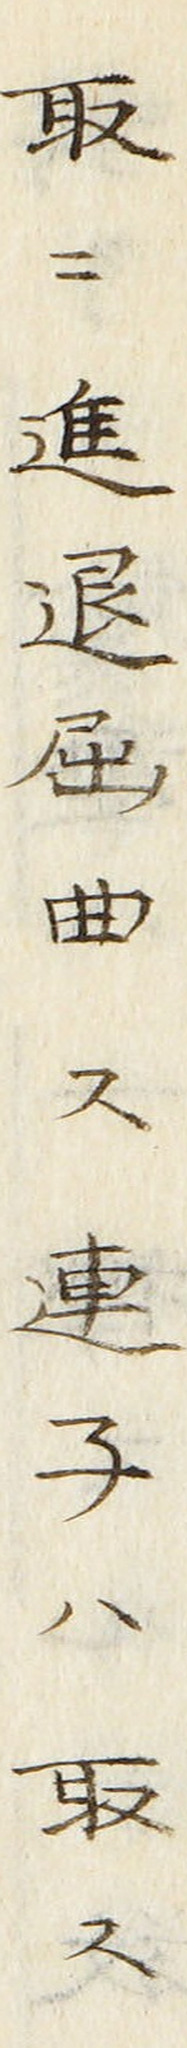取ニ進退屈曲ス連子ハ取ス
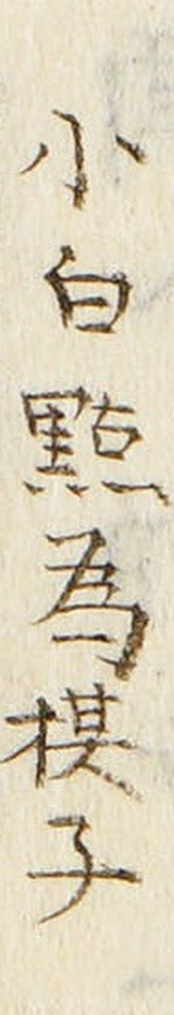小白点為棋子
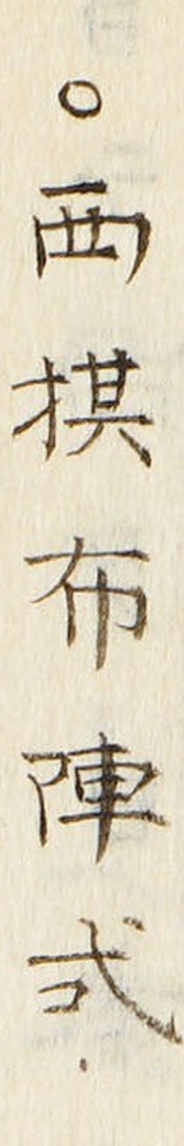〇両棋布陣式
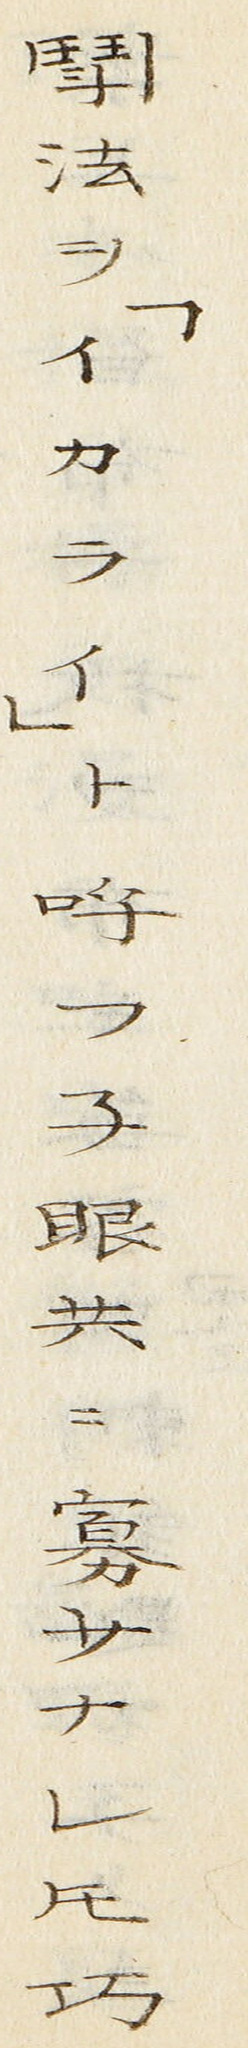闘法ヲ「イカライ」ト呼フ子眼共ニ寡少ナレトモ巧
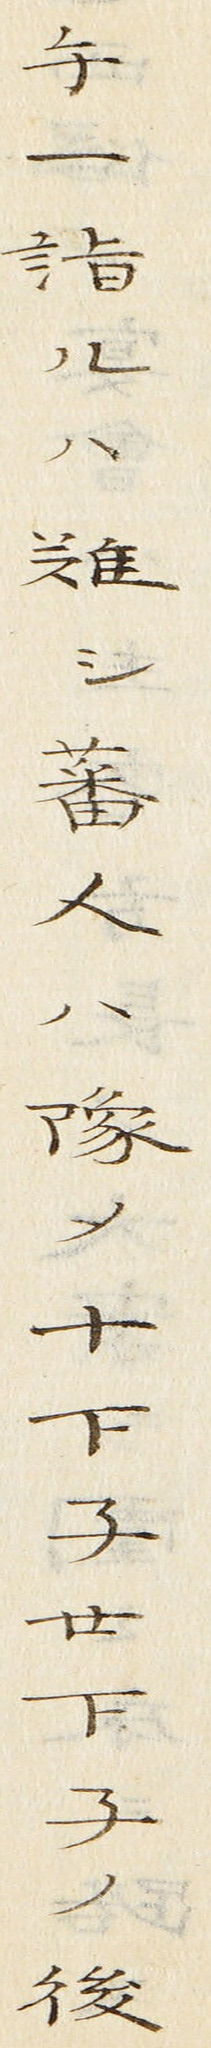手一詣ルハ難シ蕃人ハ予メ十下子廿下子ノ後
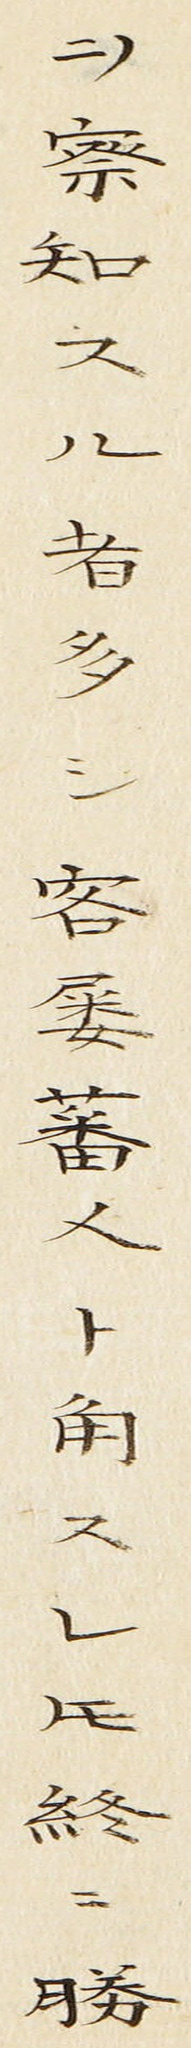ヲ察知スル者多シ客屡蕃人ト角スレトモ終ニ勝
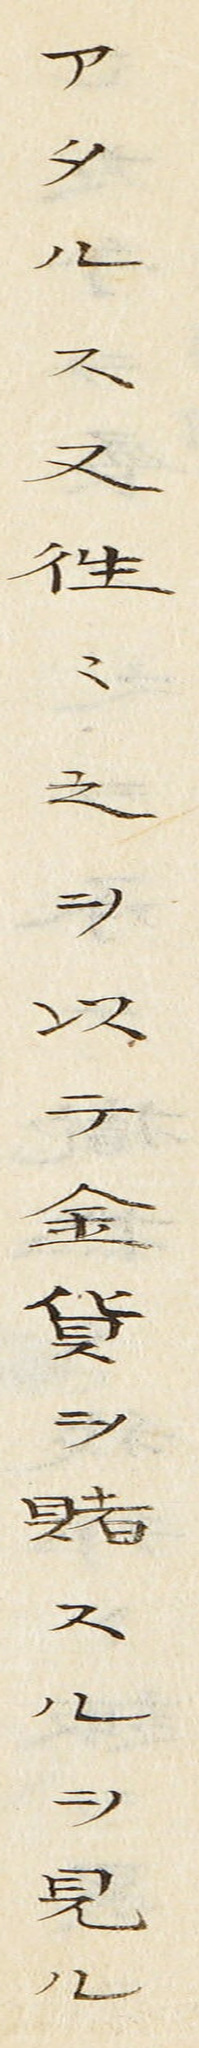アタルス又往〃之ヲ以テ金貨ヲ賭スルヲ見ル
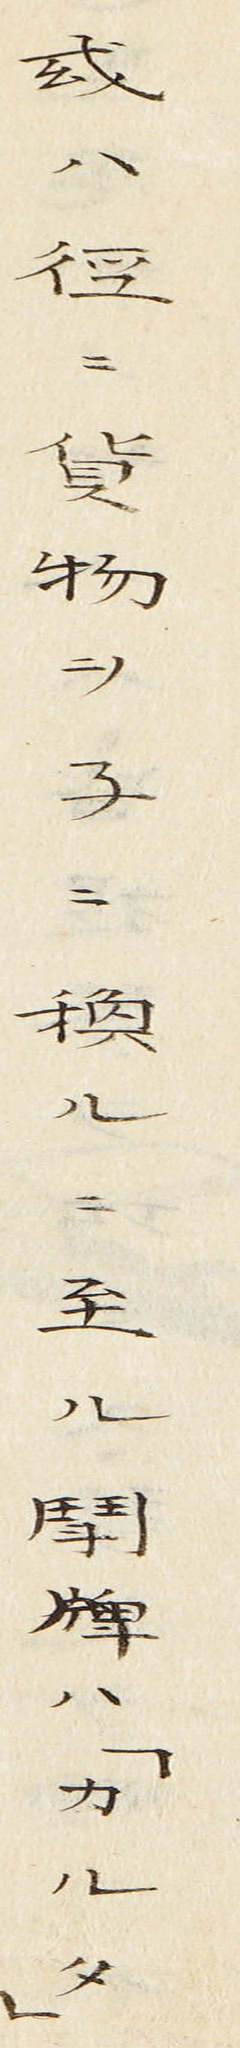或ハ径ニ貨物ヲ子ニ換？ルニ至ル闘牌ハ「カルタ」
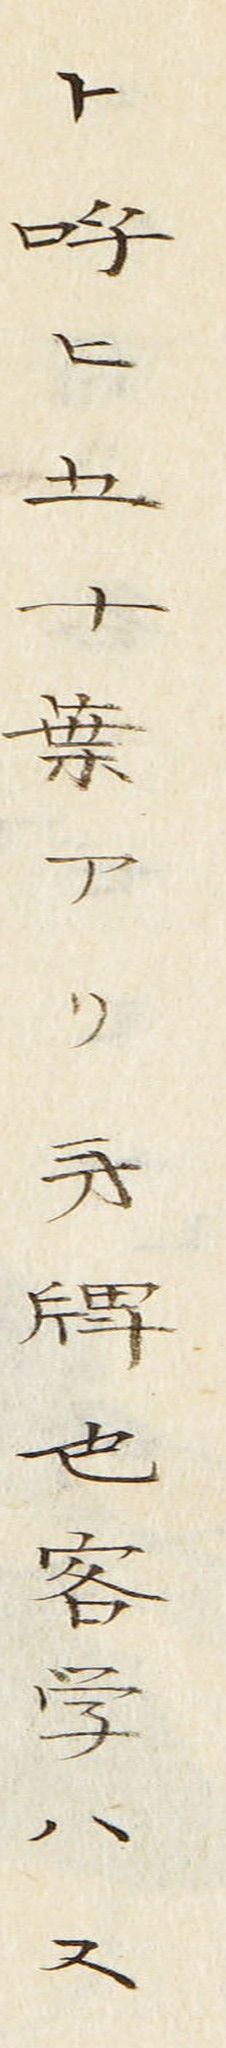ト呼ヒ五十葉アリ牌也客学ハス
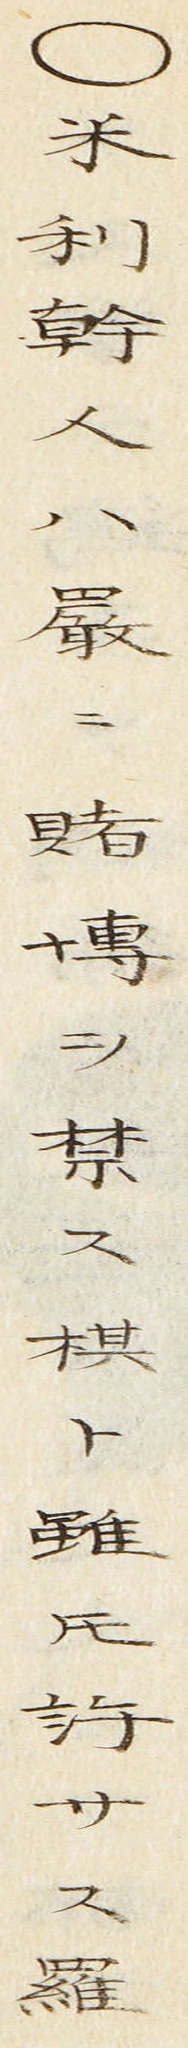〇米利幹人ハ厳ニ賭博ヲ禁ス棋ト雖トモ許サス羅
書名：蕃談
